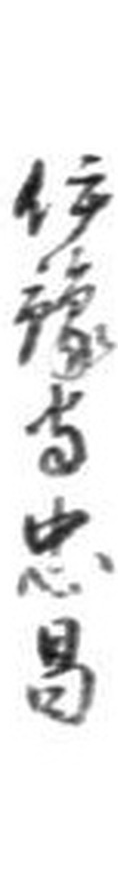伊予守忠昌
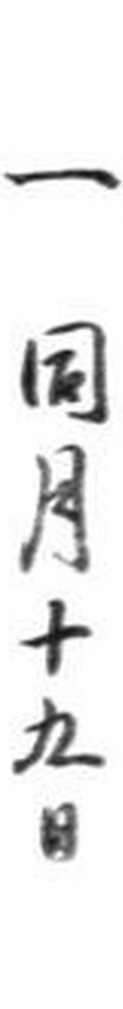一同月十九日
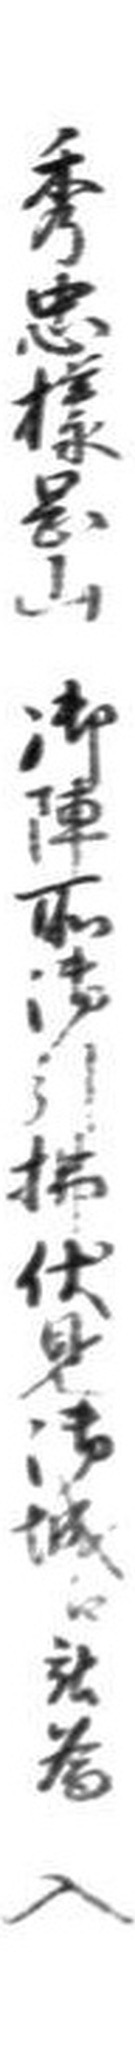秀忠様岡山御陣所御引払伏見御城江被為入
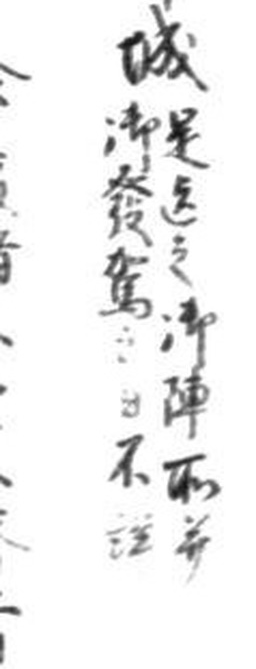御発駕之日不詳
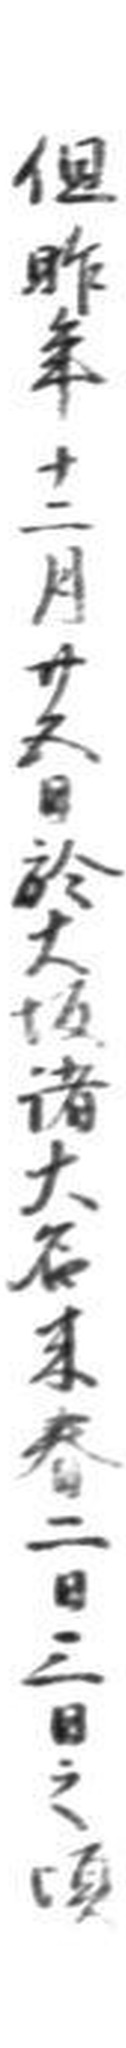但昨年十二月廿五日於大坂諸大名来春二日三日之頃

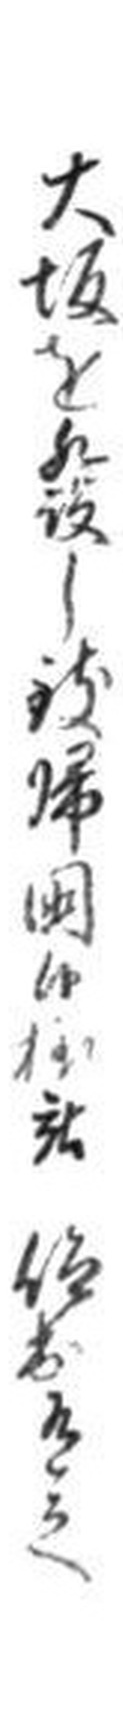大坂を発し致帰国候様被仰出有之
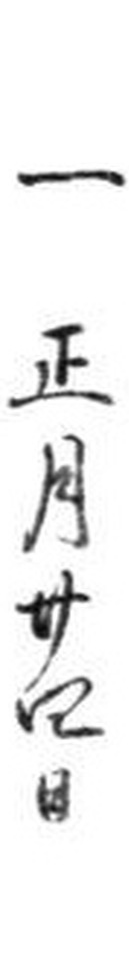一正月廿四日
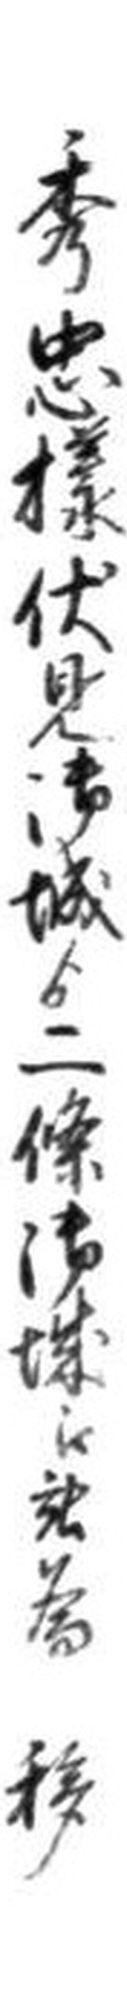秀忠様伏見御城ゟ二條御城江被為移
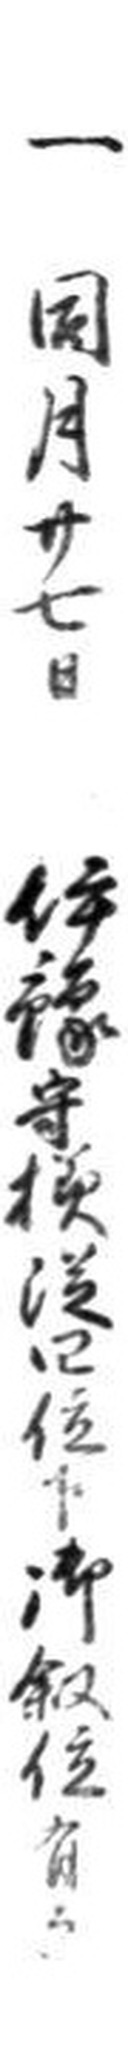一同月廿七日伊予守様従四位下御叙位有之
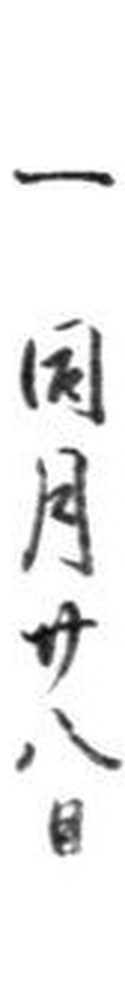一同月廿八日
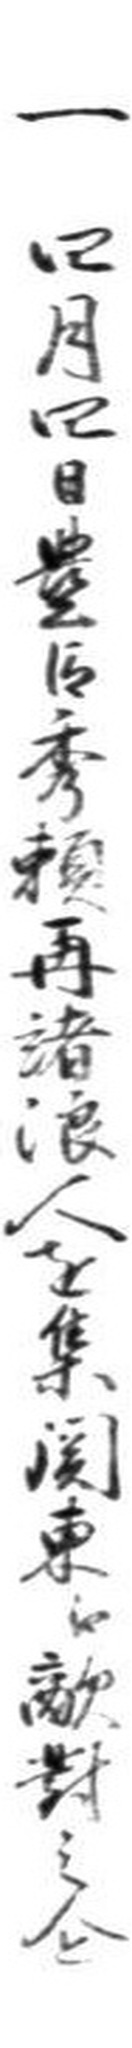一四月四日豊臣秀頼再諸浪人を集関東江敵対之企
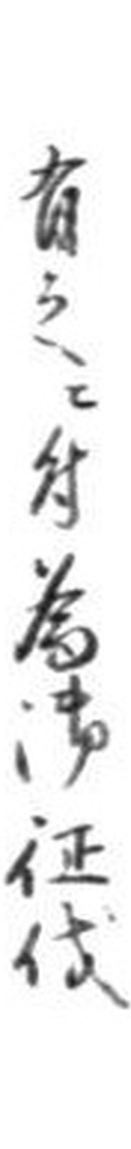有之ニ付意為御征伐
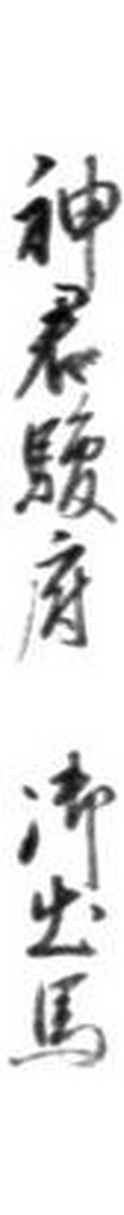神君駿府御出馬
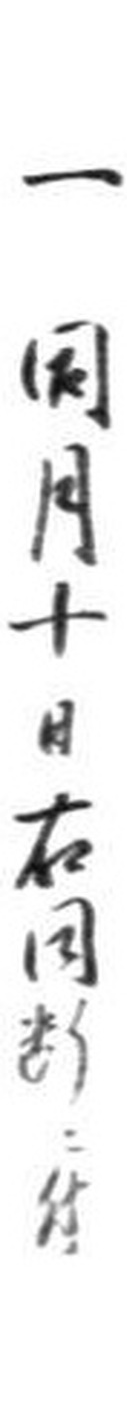一同月十日右同断ニ付
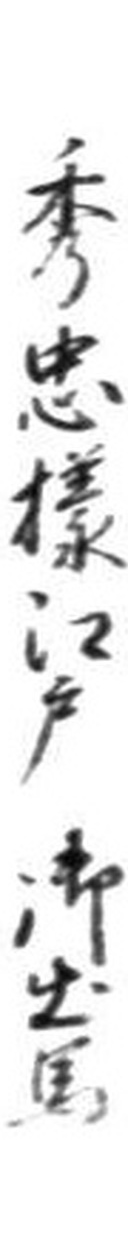秀忠様江戸御出馬
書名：家譜 二 忠直公 従文禄四年到慶安四年
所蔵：福井県文書館 Fukui Prefectural Archives
